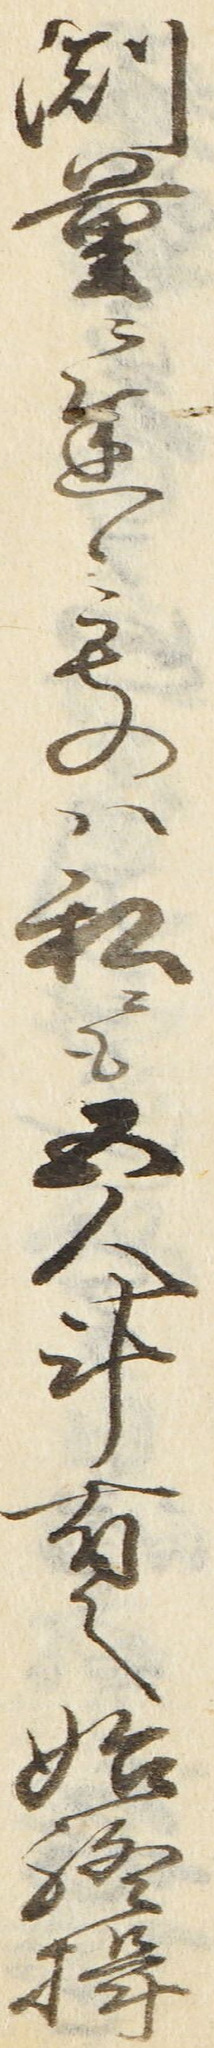測量ニ達候ものハ私ニも五人斗有之終始楫
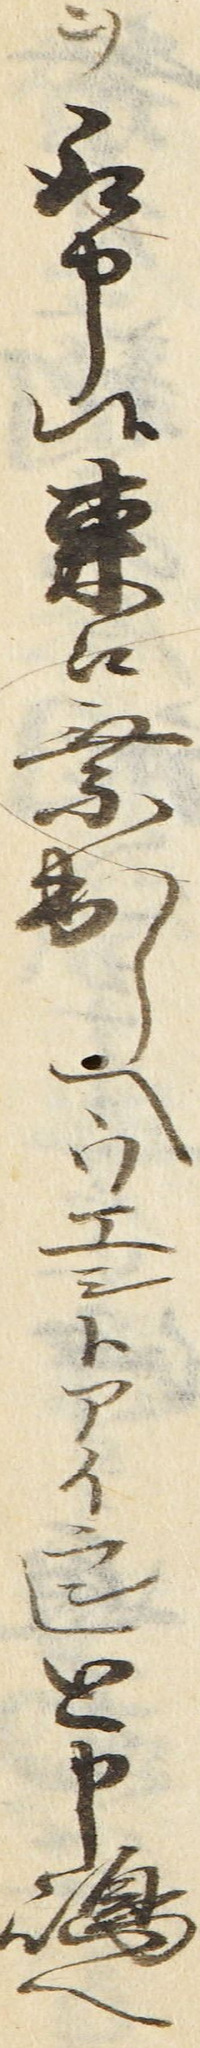ヲ取申候東に乗出し「ウエシトアイラン」と申嶋へ

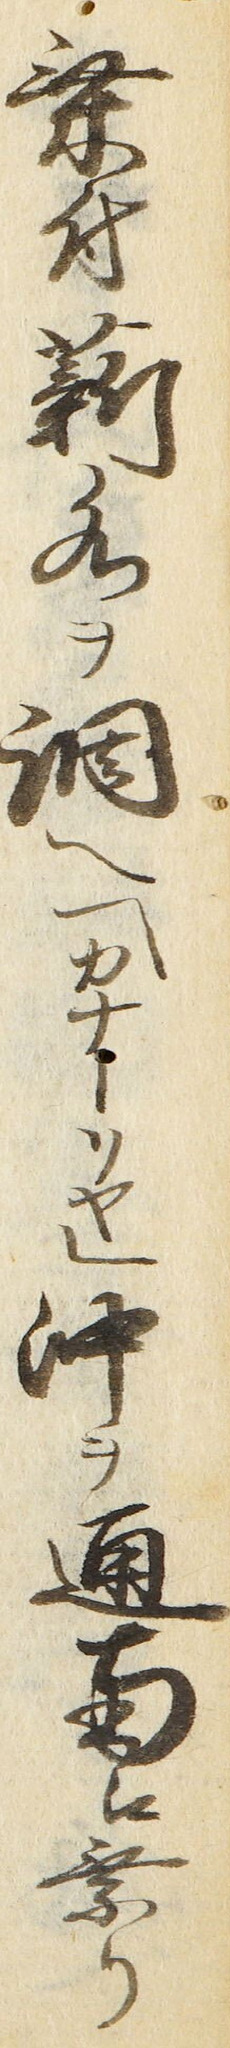乗付薪水ヲ調へ「カナーリヤ」沖ヲ通南江乗り
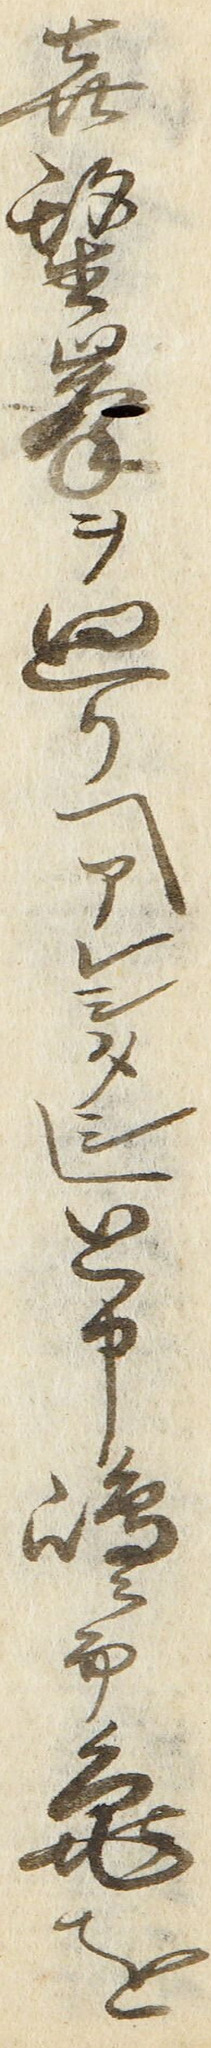喜望峯ヲ廻り「アレシタシ」と申嶋ニ而亀を
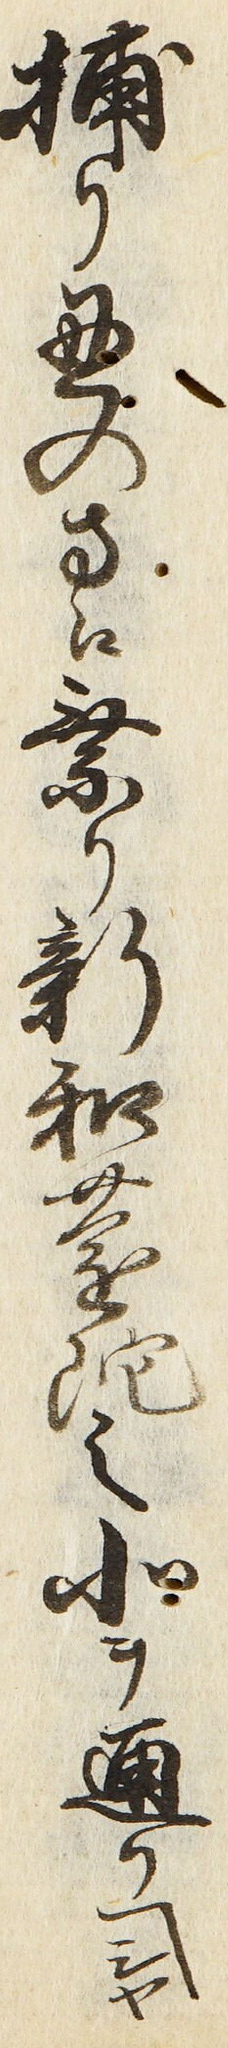捕り丑の方江乗り新阿蘭陀之北ヲ通り「シヤ
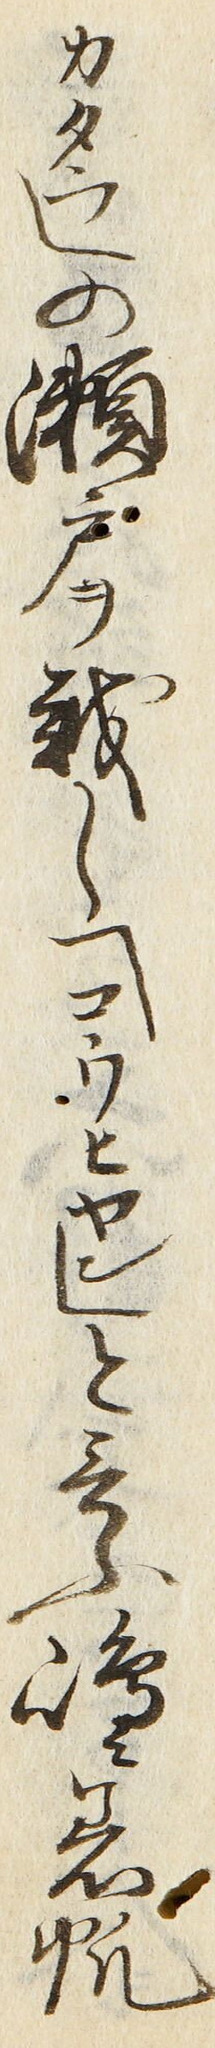カタラ」の瀬戸ヲ越し「コウヒヤン」と言ふ嶋ニ着帆
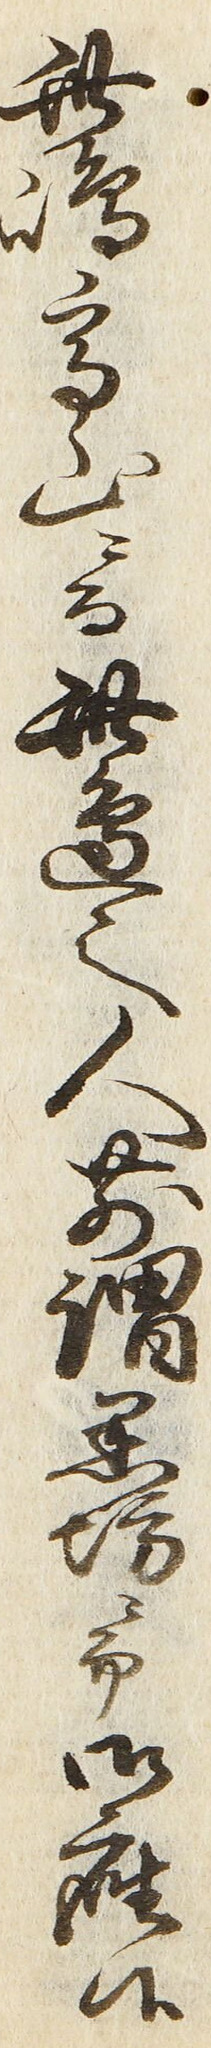此嶋高山ニ而此邊之人前謂黒坊ニ而御座候
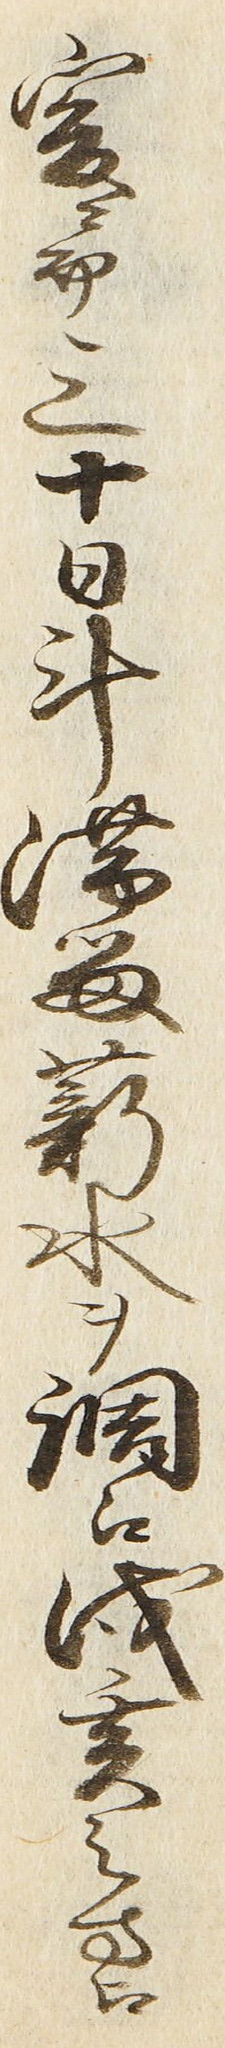爰ニ而三十日斗滞留薪水を調え戌亥之方江
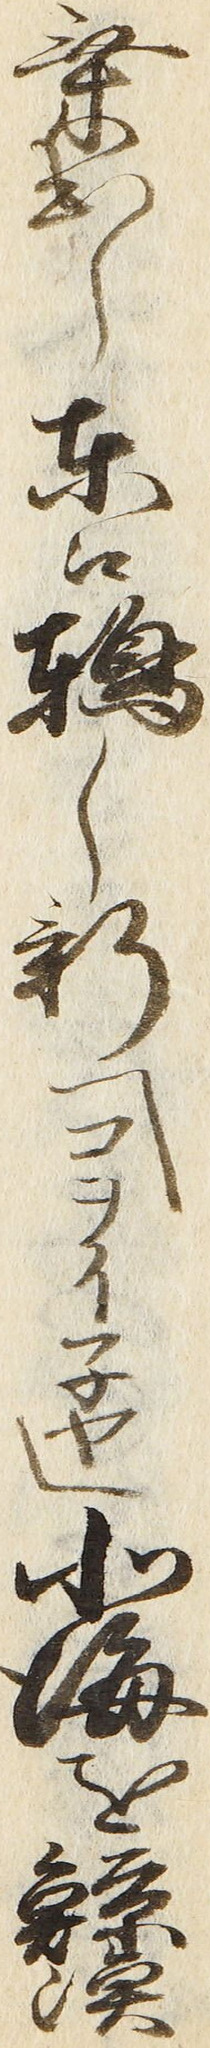乗出し東江轉し新「コヲイ子ヤ」北海を鯨漁
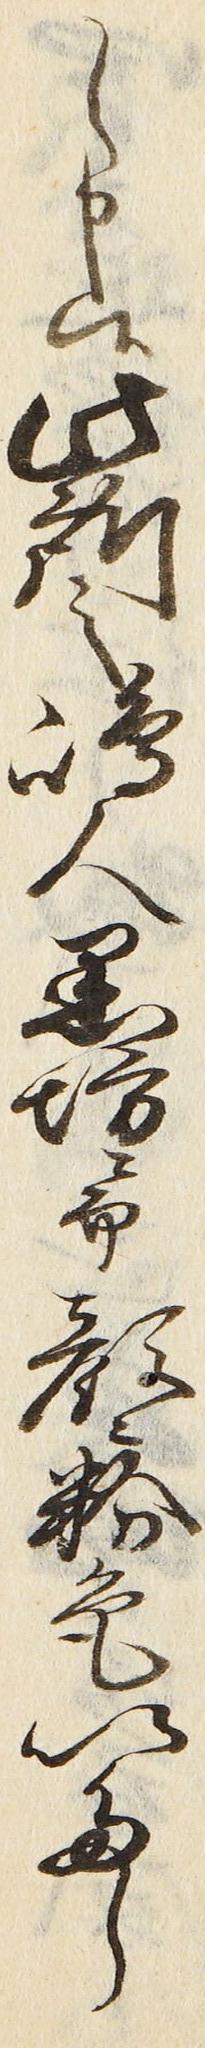し申候此所之嶋人黒坊ニ而顔ニ粉色いたし
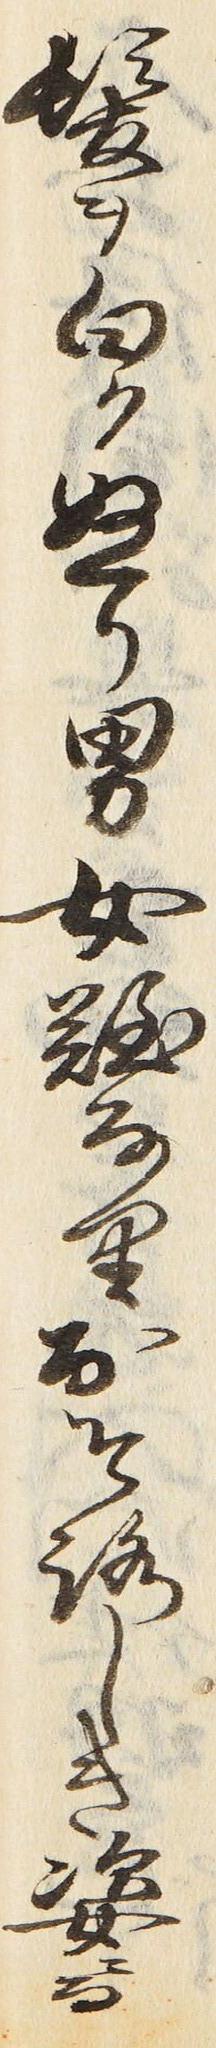髪ヲ白クぬり男女難なりおそろしき姿ニ而
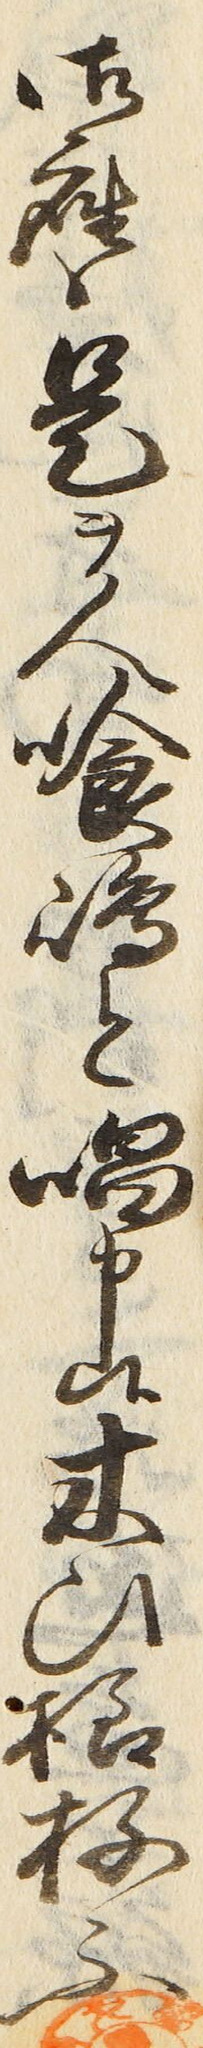御座候是ヲ人喰嶋と唱申候木引様抔ふ
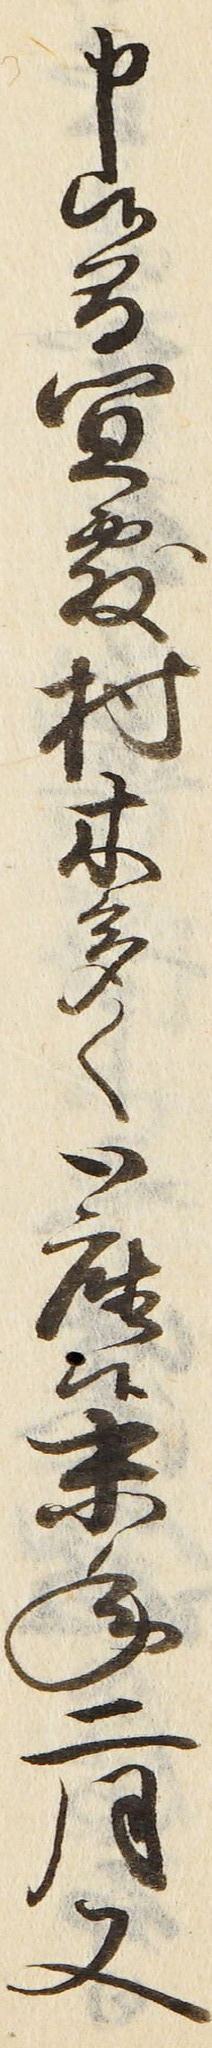申候間宜敷村木多く御座候未年二月又
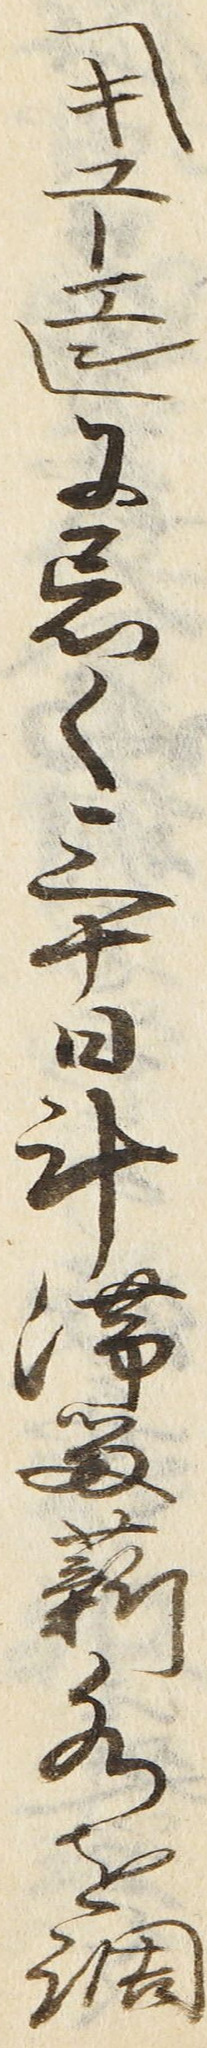「キユーエン」に着し三十日斗滞留薪水を調
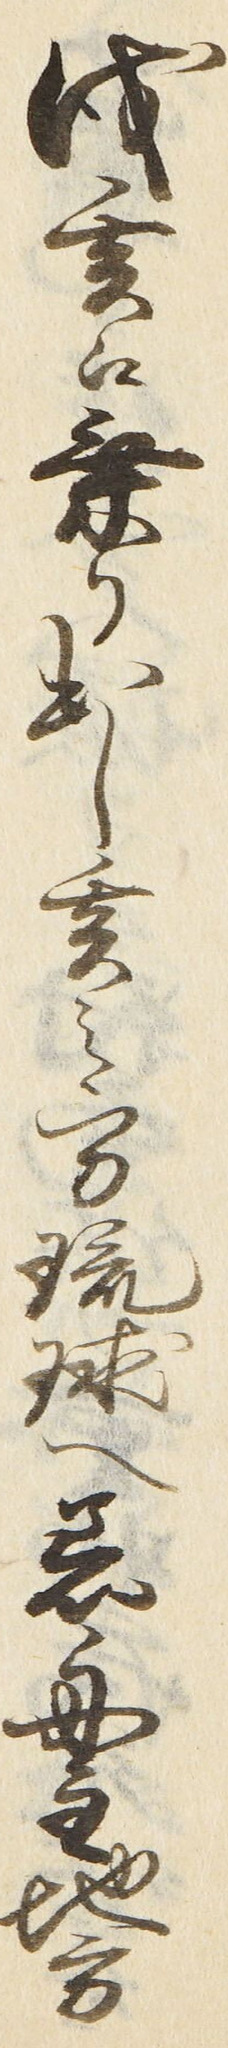戌亥江乗り出し亥之方琉球へ着舟主地方
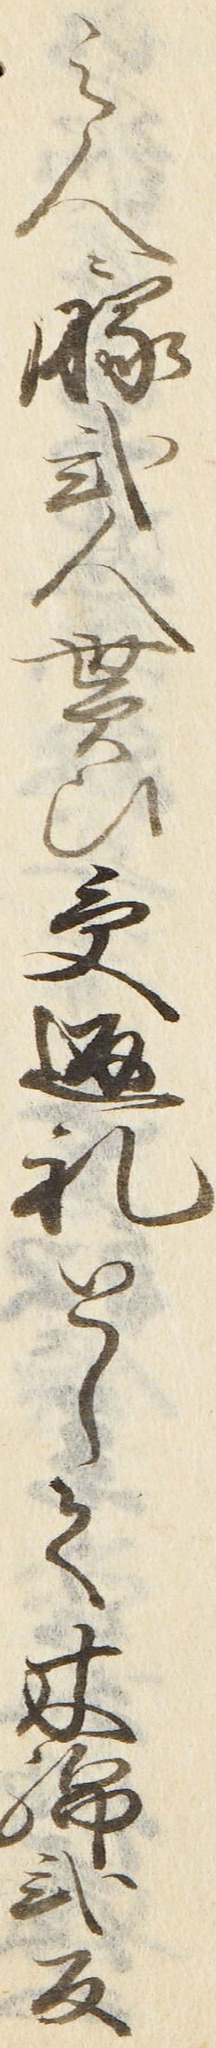之人ニ豚弐人貰ひ受返礼として木綿弐反
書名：漂客談寄
